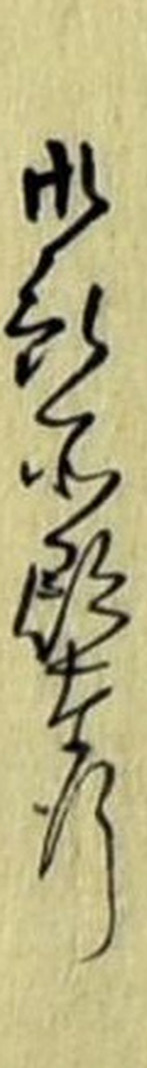御預所郡奉行

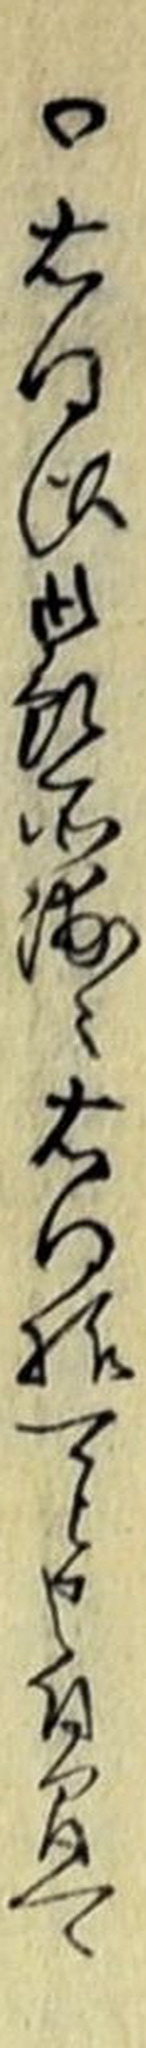○右同趣御預所浦々右同様可被申付置候
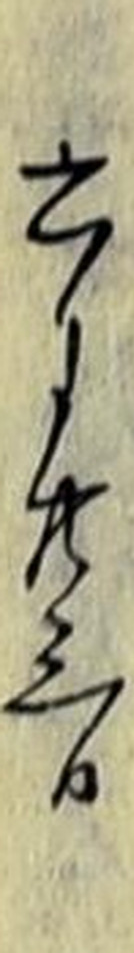六月廿三日
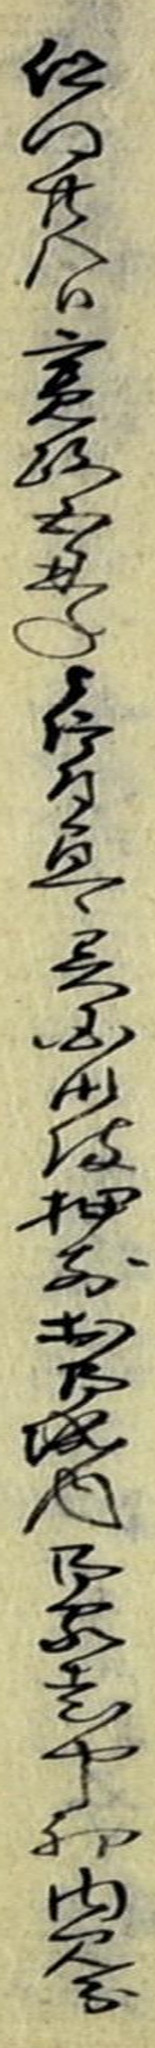但同廿八日寛政五丑年被仰付置候異国御侍押於於御城内御家老中初内見分
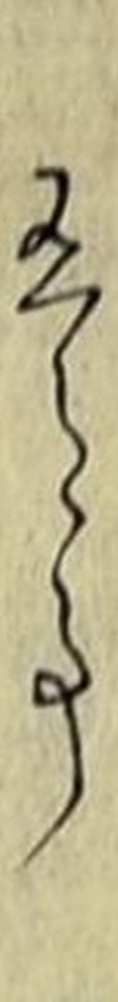有之候事
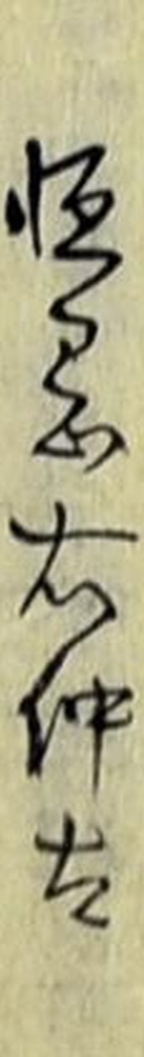恒岡右仲太
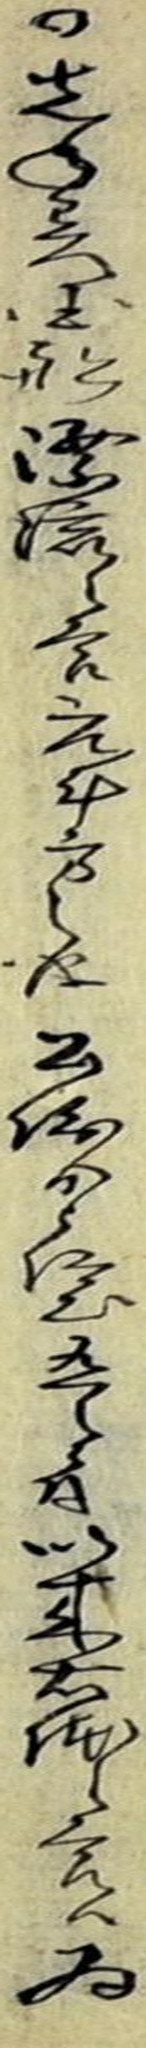○先年異国船漂流之節取斗方之儀公儀ゟ被仰出有之に付以来右体之節は為
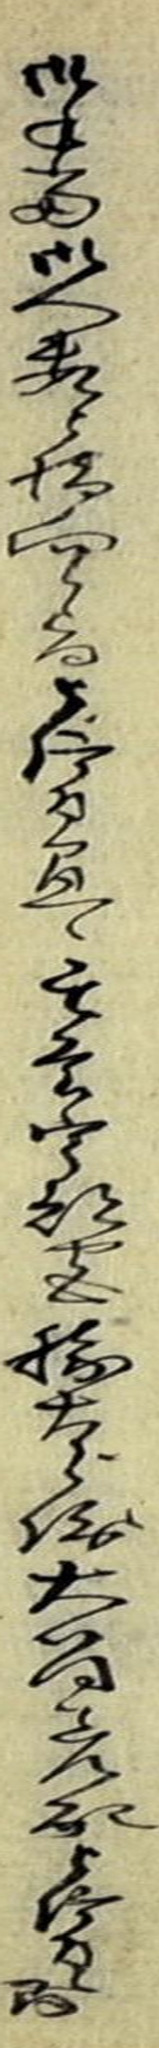御手当御人数被指向候旨被仰付置候其節宇都宮勝太郎儀大筒差配被仰付候間
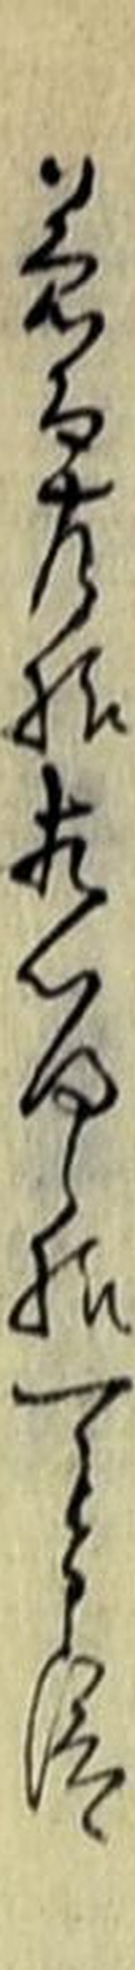兼而左様相心得候様可被申渡候
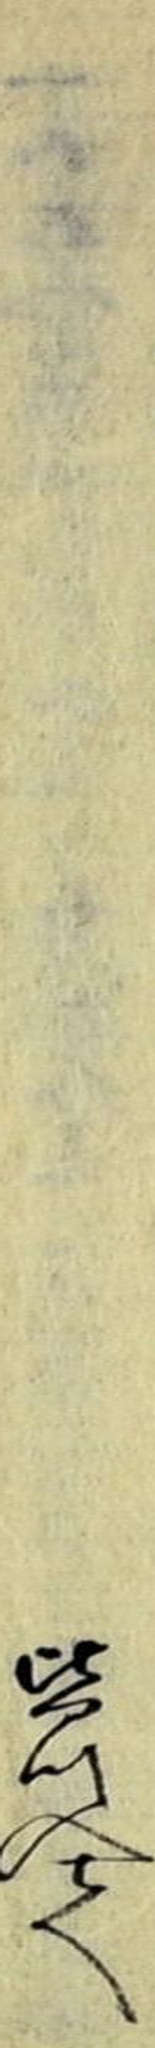皆川舎人
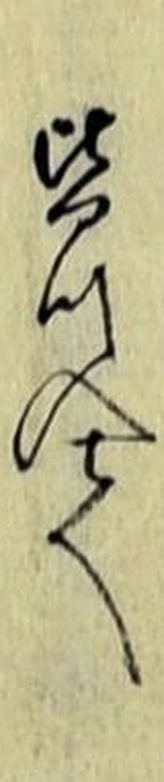皆川舎人
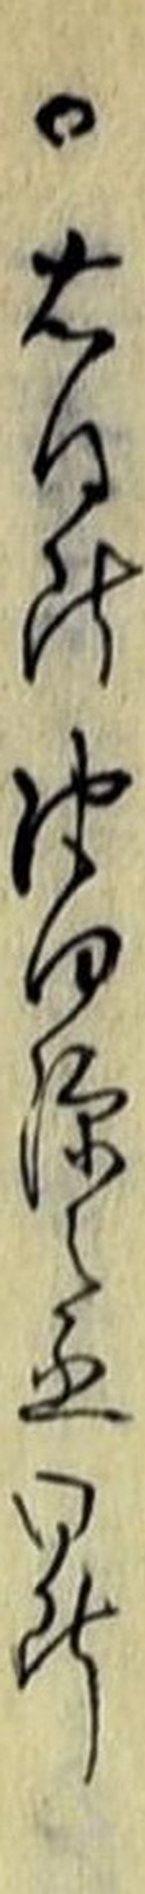○右同断津田源之丞同断
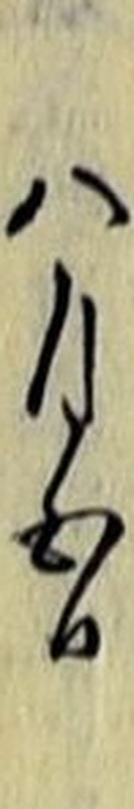八月五日
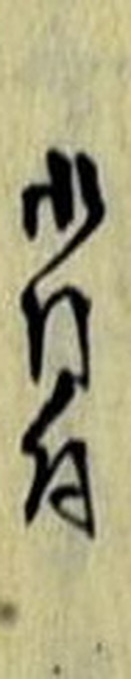御目付
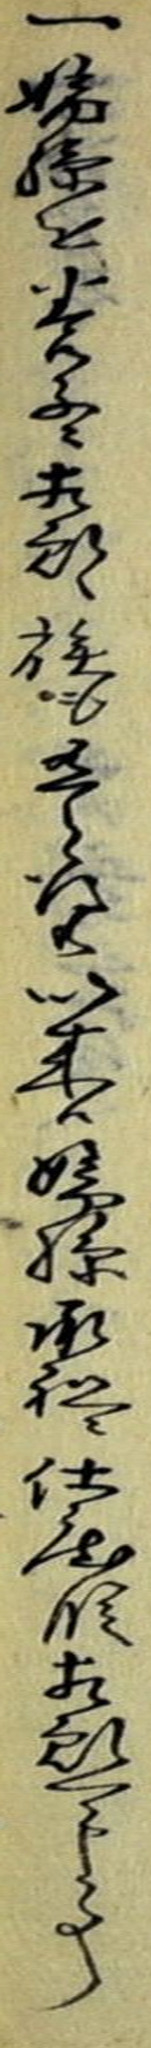一嫡孫を養子に相願候族も有之候得共以来は嫡孫承祖に仕度段相願可申事
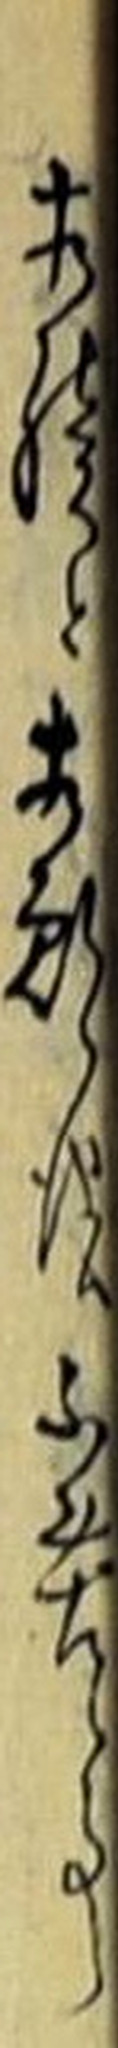相続に相願候儀は不苦候事
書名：命令之部 四
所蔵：福井県文書館 Fukui Prefectural Archives
